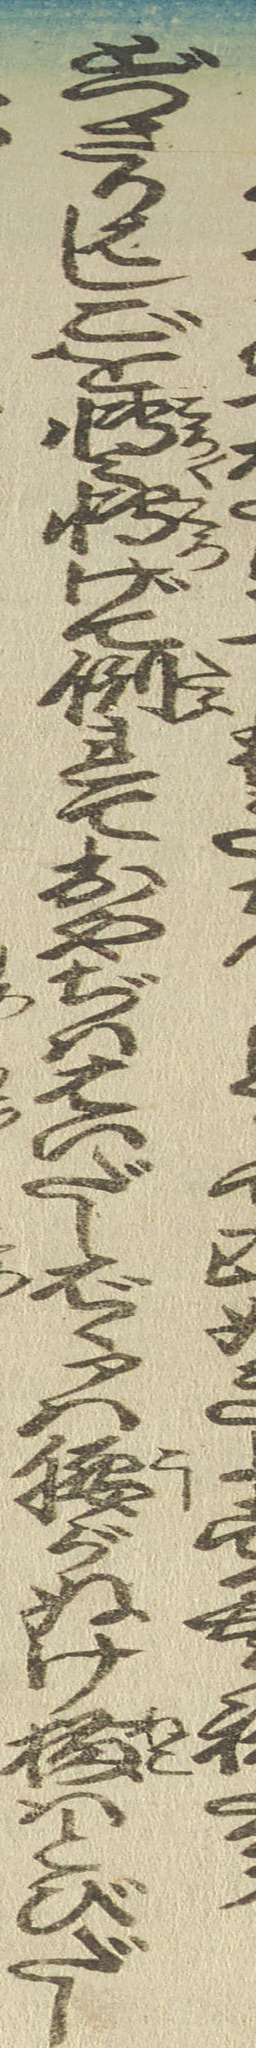どつさりはしごを轉〻轉げて倒れておやぢハはいだしばゝアハ腰がぬけ猫ハとびだし
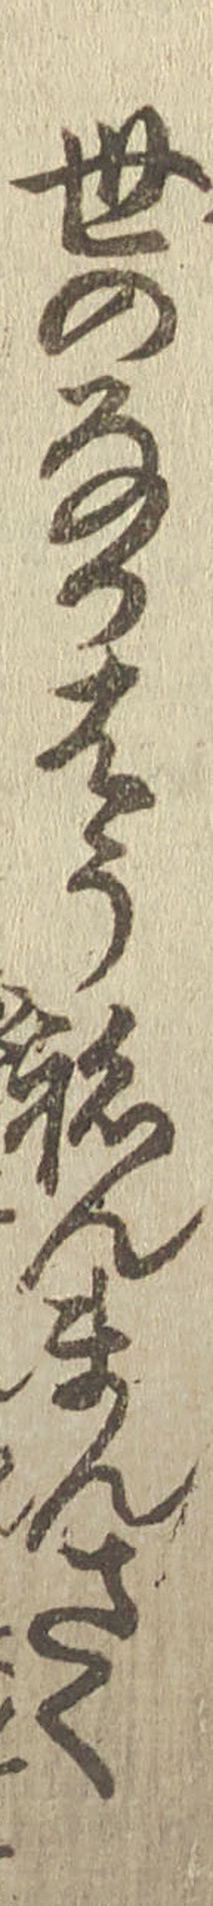世のなかはうねんまんさく
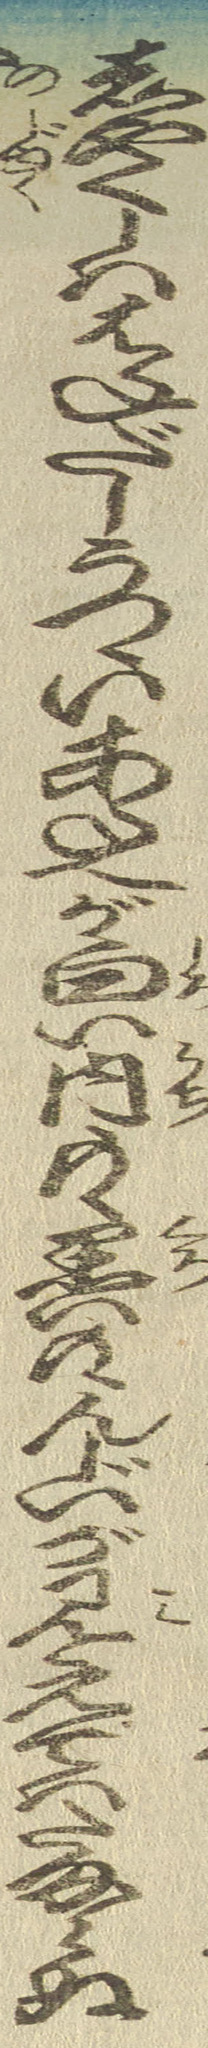しやくしハはねだしうつゝいあねへが白い内もゝ黒いもんじいが見えてハたまらぬ
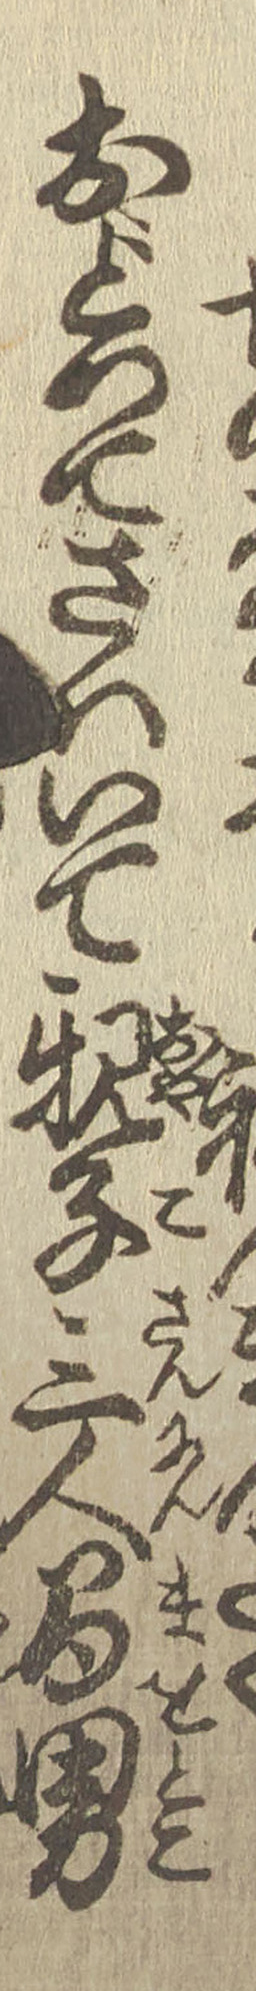おどつてさハいて親子三人間男
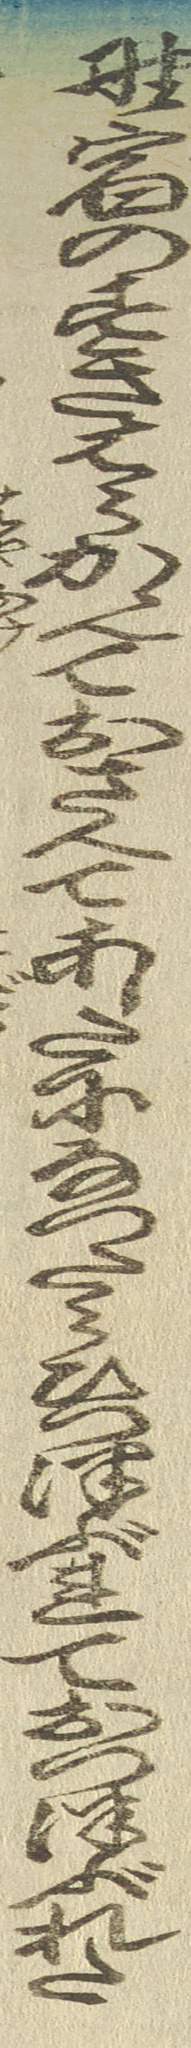野宿のすきはらかゝへておさへてあしたになつたらひつつぶれておつつぶれた
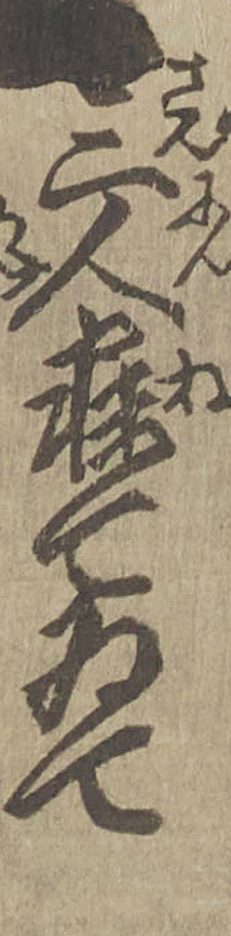三人寐てゐて
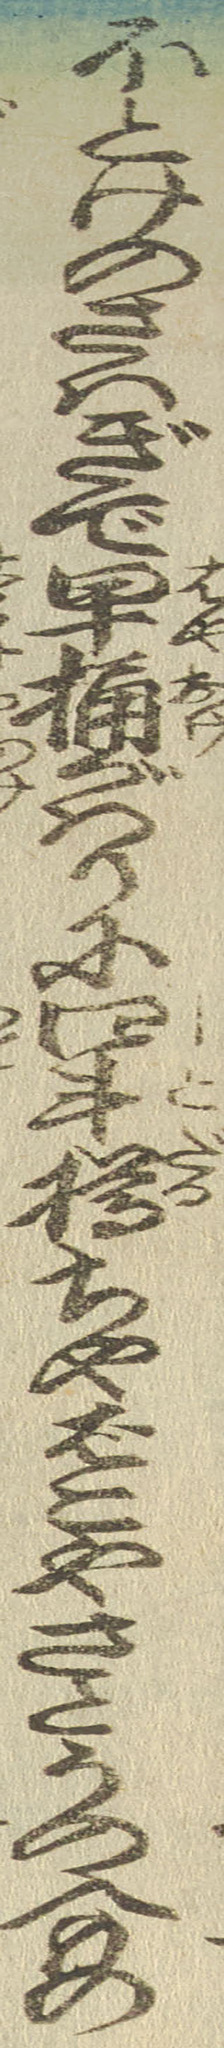ほとけのさハぎで早桶がハりに四斗樽ちやばこやさとうの入もの
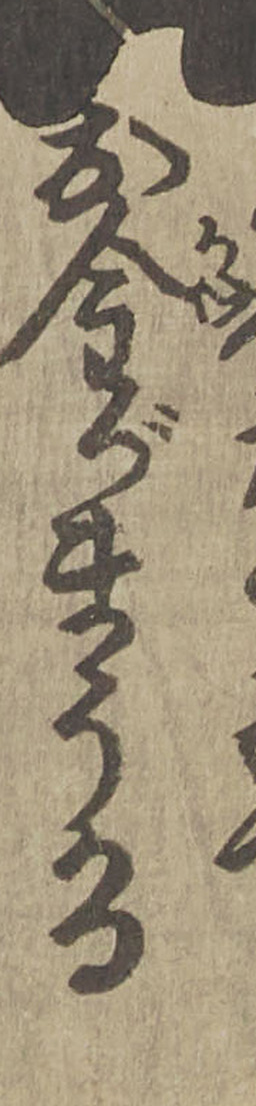お金がまうかる
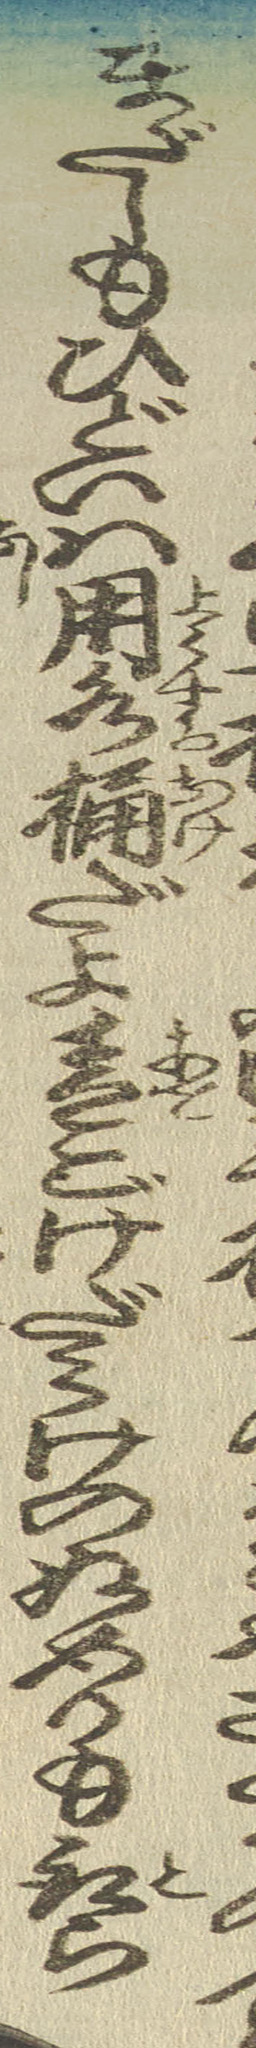まだしもひどいハ用水桶だよ青ごけだらけのぬめりも取ら
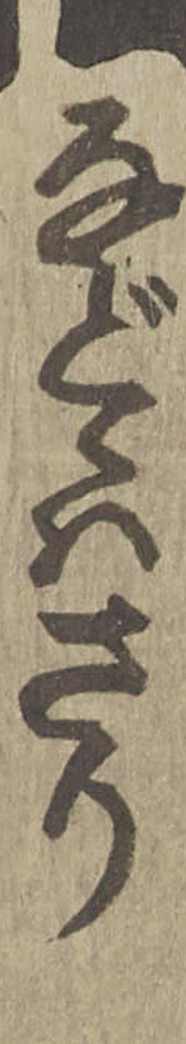などゝハさり
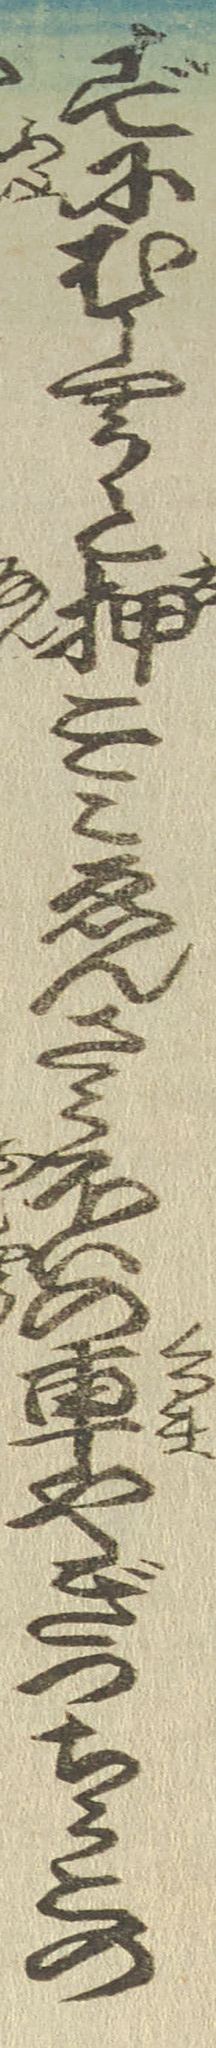ずにむしやうと押こミゑんさらほいの車やぎつちらこの
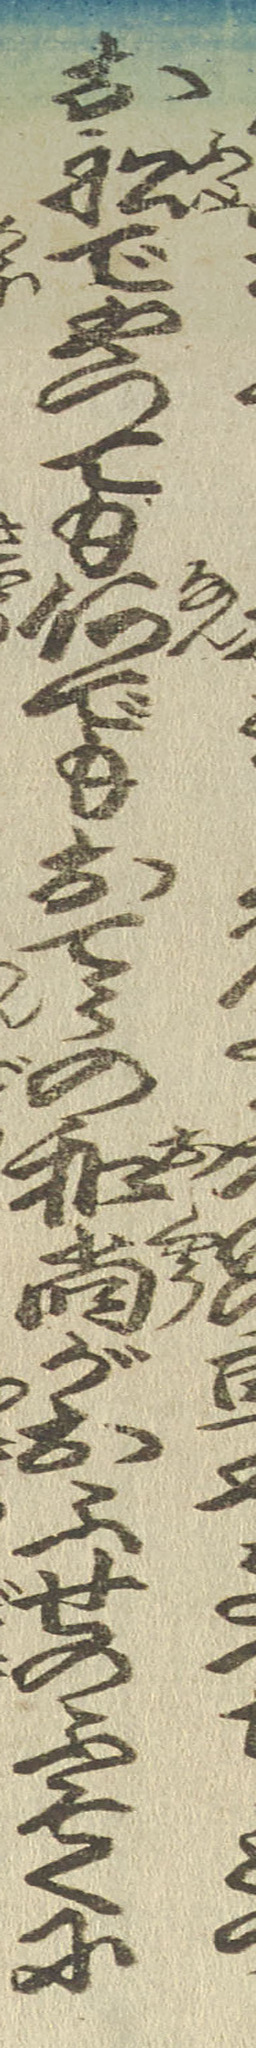お舩でやつても何でもおてらの和尚がおふせのふそくに
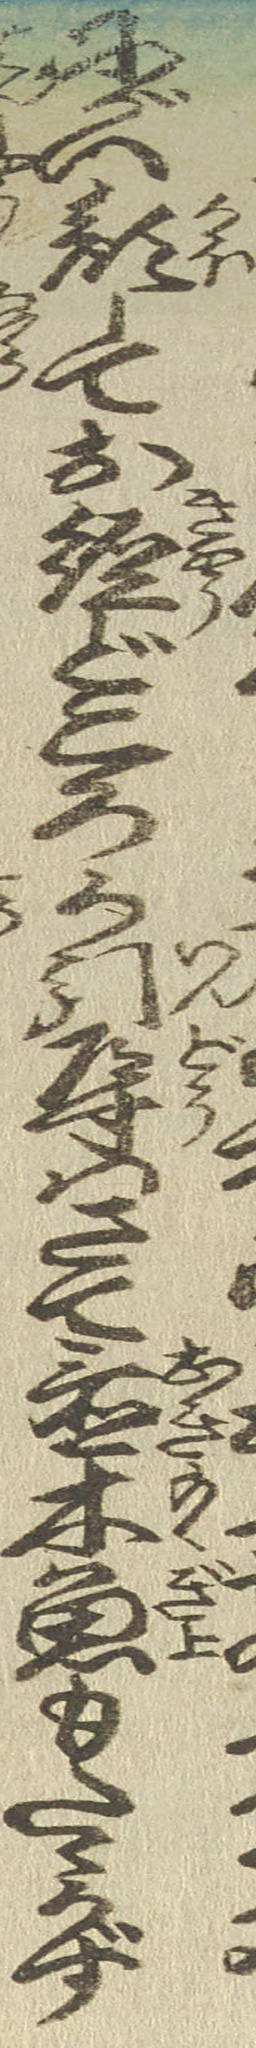にがい顔してお経どころか引導ハさて置木魚もたゝかず
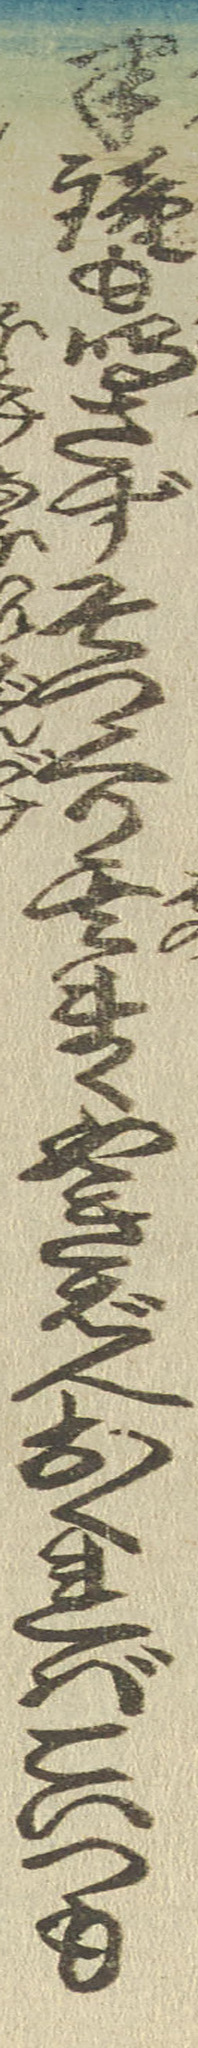半鐘も鳴さずそつくり其まゝやきばへおくれバこいつも
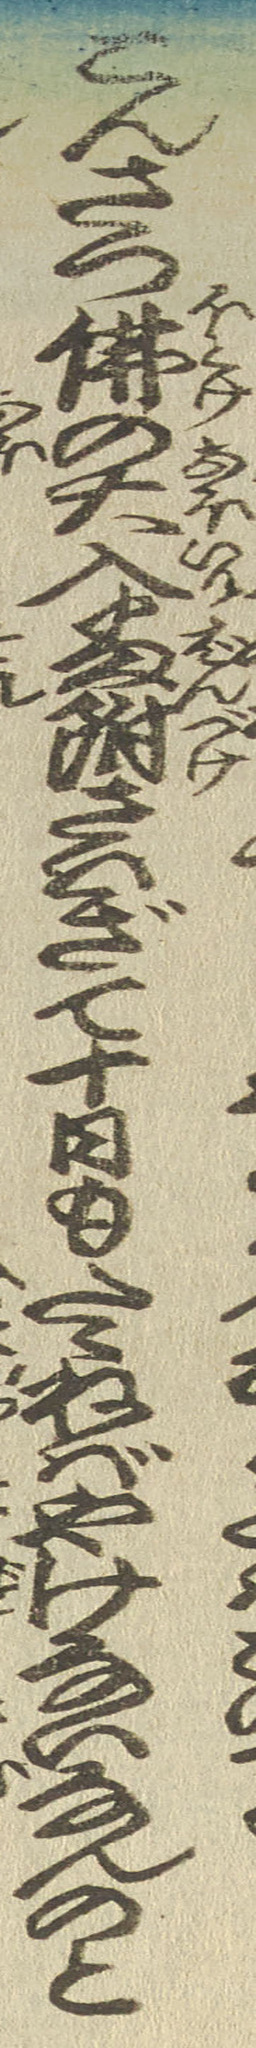こんさつ佛の大入番附さハぎて十日もたゝねバやけないなんのと
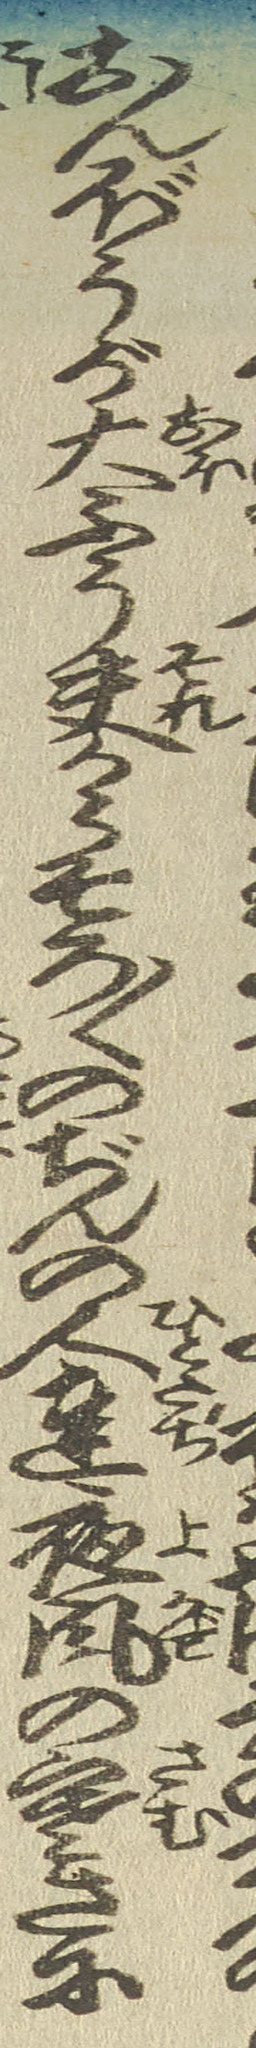おんぼうが大ふう夫からそろ〳〵のぢんの人達夜風の寒さに
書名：どらが如来世直し ちょぼくれ
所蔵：東京大学総合図書館 General Library in the University of Tokyo, JAPAN
